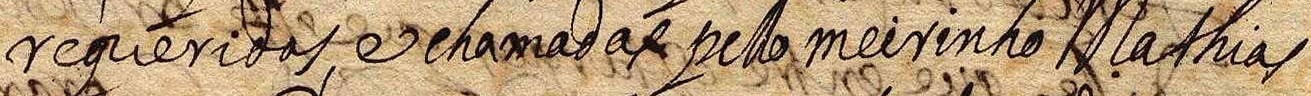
requeridas, e chamadas pello meirinho Mathias
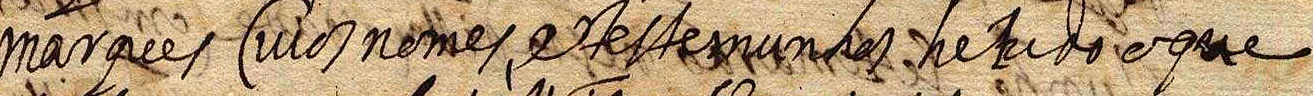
marques Cuios nomes, e testemunhos he tudo o que
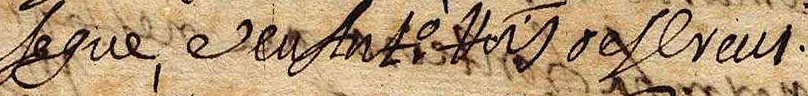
se segue, e eu Ant.o Roīs o escreui.
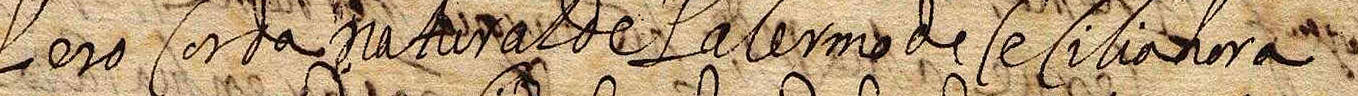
Pero Corda natural de Palermo de Cecilia hora
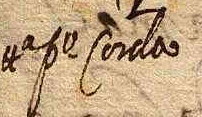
tta p.o Corda
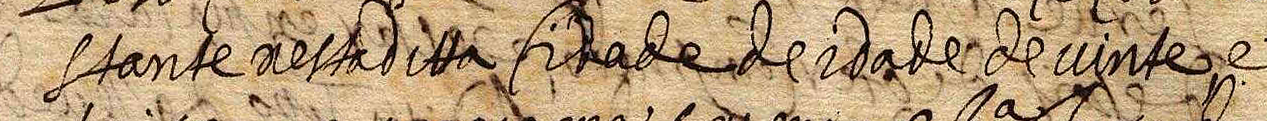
stante nesta ditta Cidade de idade de uinte e
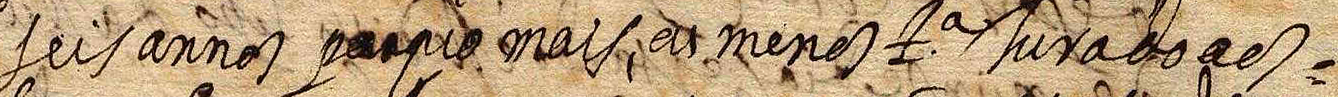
seis annos pouquo mais, ou menos t.a Iurado aos
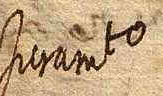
Juramto
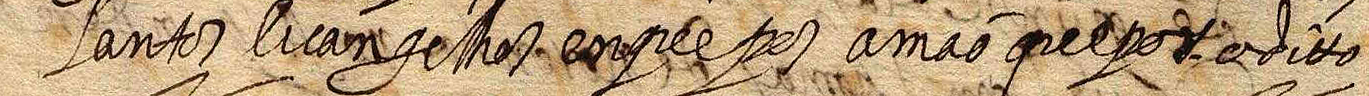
santos euangelhos en que e pos a maõ que por o ditto
